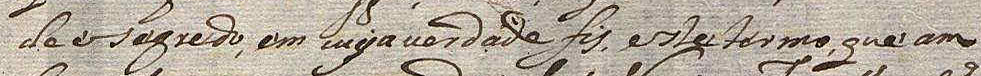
de e segredo, em cuya uerdade fis este termo, que am
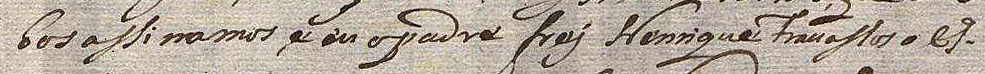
bos assinamos, e eu o padre frey Henrique Trauassos o es
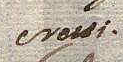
creui.
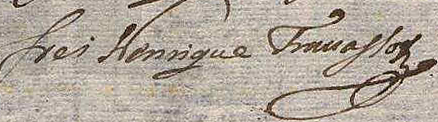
frei Henrique Trauassos
